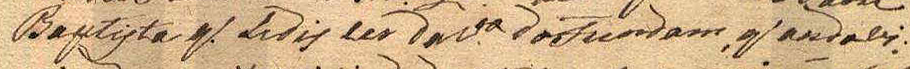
Baptista q̄ se dis ser da V.a do Fundam, q̄ anda vi
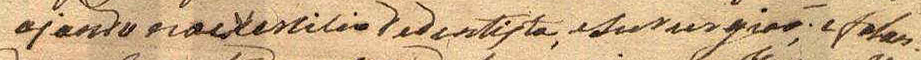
ajando no exercicio de dentista, e serurgiaõ, e falan
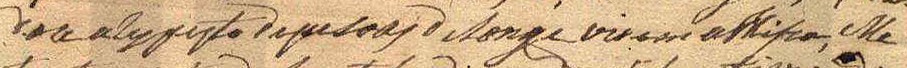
dose a Respeito de pesoas de longe virem a Missa, elle
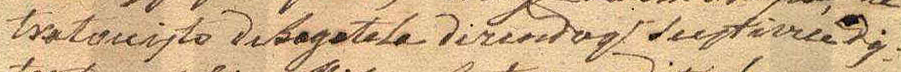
tratou isto de bagatela dizendo q̄ se estivece dis
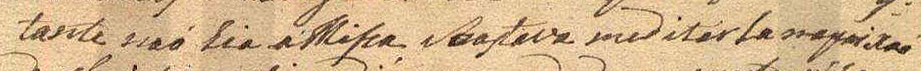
tante naõ hia a Missa, e bastava meditarla na paixaõ
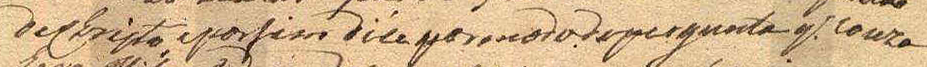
de Christo, e por fim dice por modo de pergunta q̄ couza
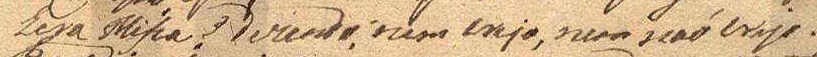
hera Missa? dezendo, nem crejo, nem naõ crejo
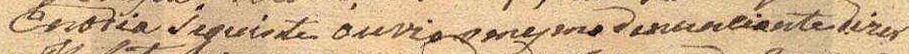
E no dia seguinte ouvio o mesmo denunciante dizer
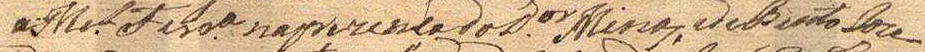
a M.el Ferr.a na prezença do D.or Minas, e de Bento Ioze
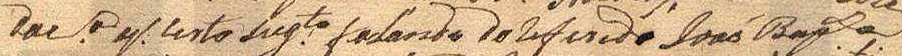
da S.a q̄ certo sug.to falando do Referido Ioaõ Bap.ta
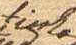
tinha
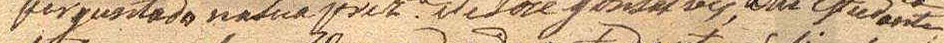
perguntado na sua prez.ça e de Ioze Gonsalves, a hū estudante
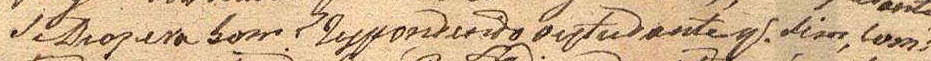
se Deos era bom? Respondendo o estudante q̄ sim, com
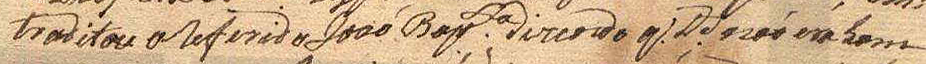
traditou o Referido Joaõ Bap.ta dizendo q̄ D.s naõ era bom
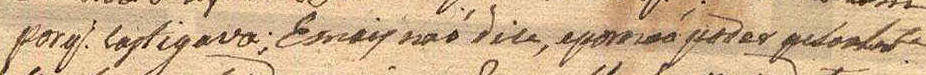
porq̄ castigava; E mais naõ dice, e por naõ poder pesoalm.te
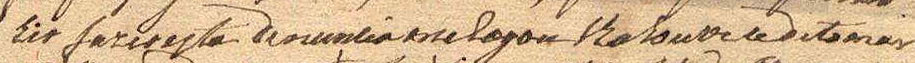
hir fazer esta denuncia me Rogou lha houvese de tomar
